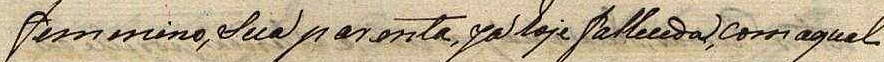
femenino, sua parenta, ja hoje falleceda,com a qual
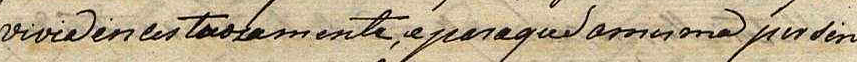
vivia incestuozamente, e para que a mesma persin
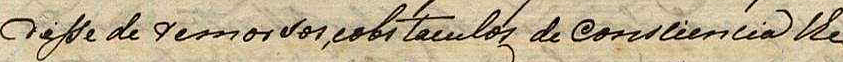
disse de remorsos, e obstaculos de consciencia lhe
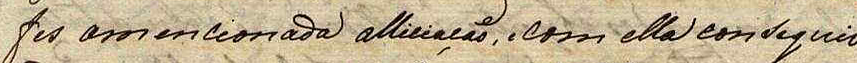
fes a mencionada alliciaçaõ, e com ella conseguio
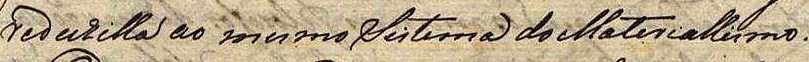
reduzi lla ao mesmo Sistema do Materiallismo.
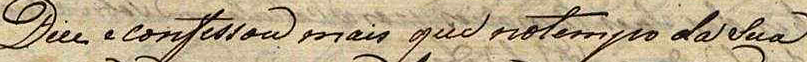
Dice e confessou mais que no tempo da sua
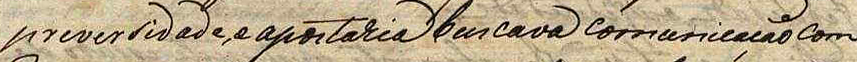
preversidade, e apostazia buscava comunicaçaõ com
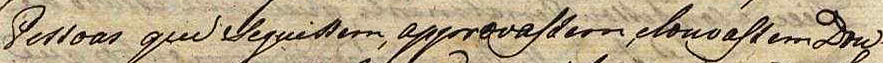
Pessoas que seguissem, approvassem, e louvassem Dou
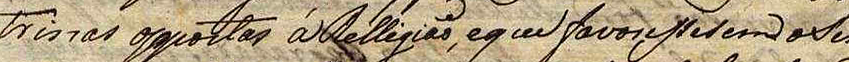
trinas oppostas à Relligiaõ, e que favoressesem o Sis
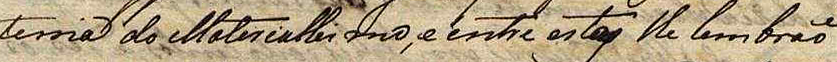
tema do Materiallismo, e entre estas lhe lembraõ
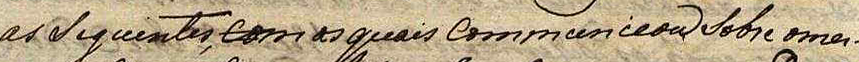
as seguintes, com as quais communicou sobre o mes
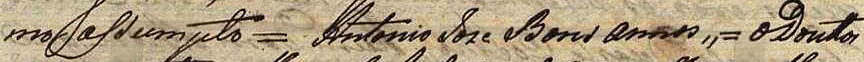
mo assumpto = Antonio Joze Bons Annos,, = o Doutor
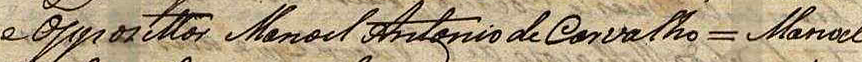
e Oppozettor Manoel Antonio de Carvalho = Manoel
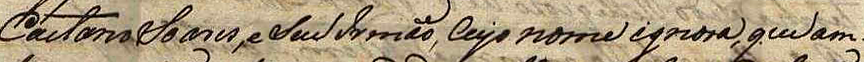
Caetano Soares, e seu Irmaõ, cujo nome ignora, que am
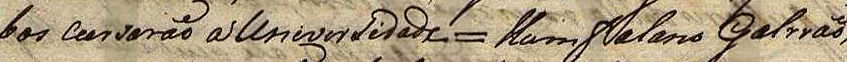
bos cursaraõ a Universidade = Hum folano Galrraõ,
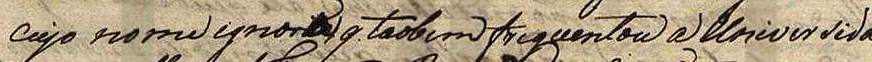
cujo nome ignora q. taobem frequentou a Universida
